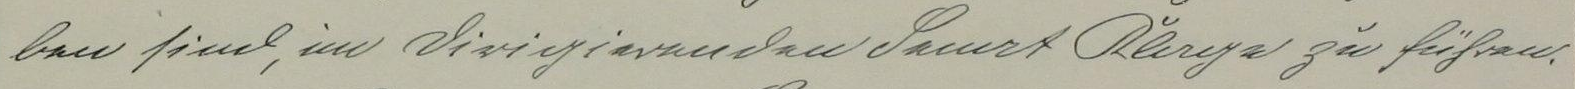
ben sind, im Dirigierenden Senat Klage zu führen.
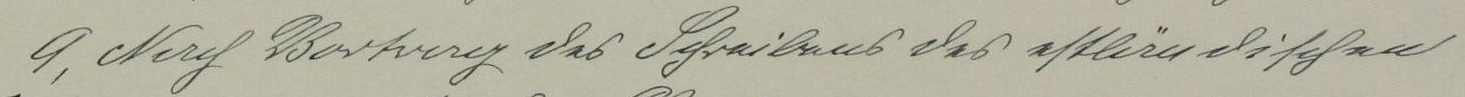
9. Nach Vortrag des Schreibens des estländischen
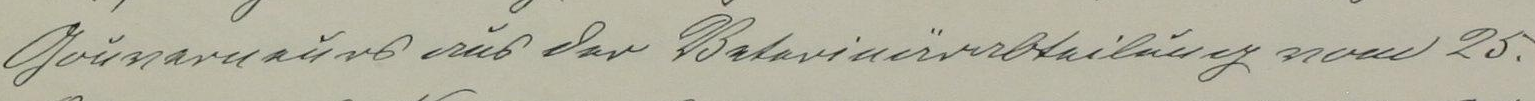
Gouverneurs aus der Veterinärabteilung vom 25.
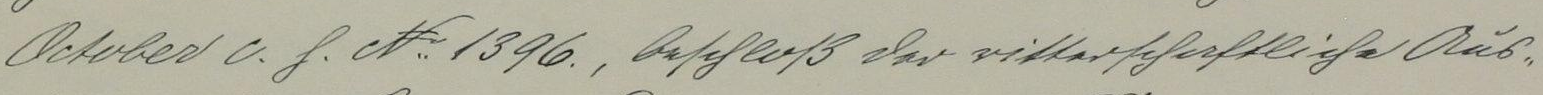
October c. s. No. 1396., beschloß der ritterschaftliche Aus-
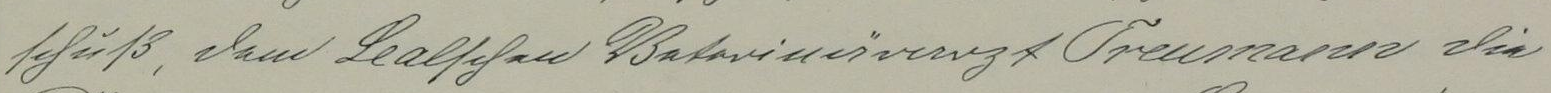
schuß, dem Lealschen Veterinärarzt Treumann die
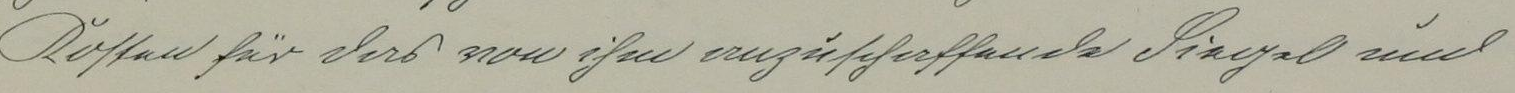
Kosten für das von ihm anzuschaffende Siegel und
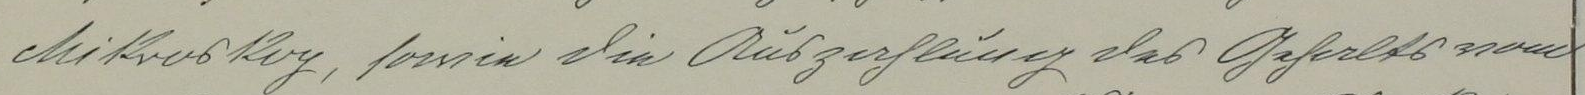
Mikroskop, sowie die Auszahlung des Gehalts vom
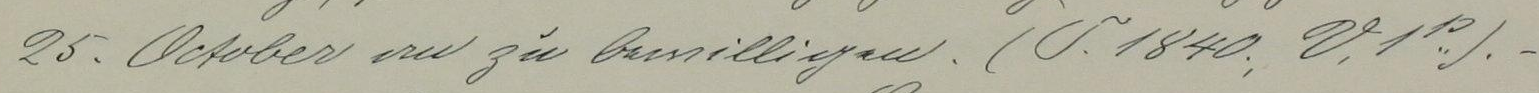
25. October an zu bewilligen. (T.1840; V.1p).
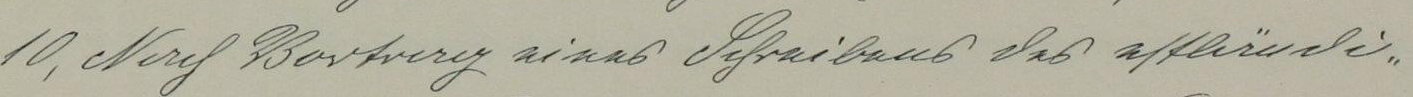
10. Nach Vortrag eines Schreibens des estländi-
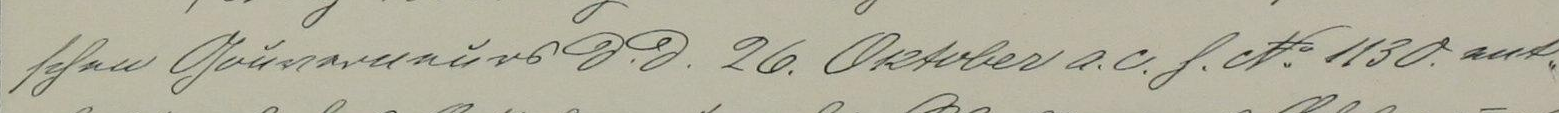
schen Gouverneurs d.d. 26. Oktober a.c. s. No. 1130. ent-
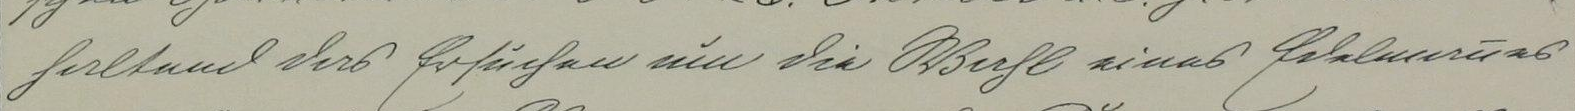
haltend das Ersuchen um die Wahl eines Edelmannes
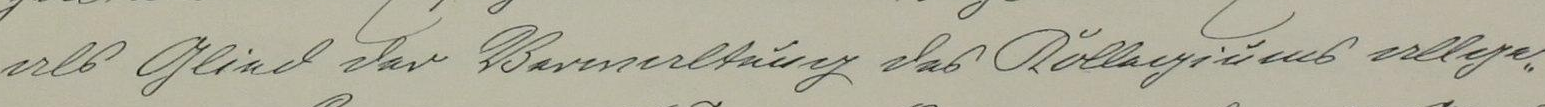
als Glied der Verwaltung des Kollegiums allge-
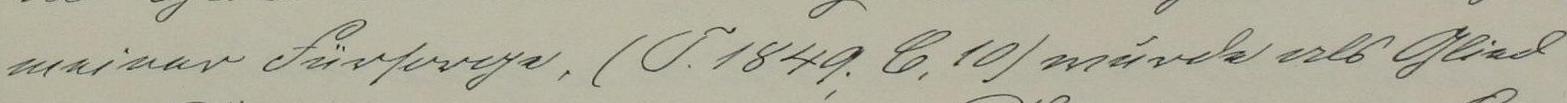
meiner Fürsorge, (T.1849; C.10) wurde als Glied
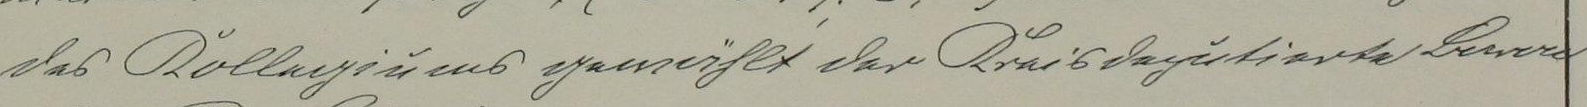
des Kollegiums gewählt der Kreisdeputierte Baron
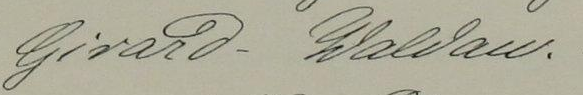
Girard-Waldau.
